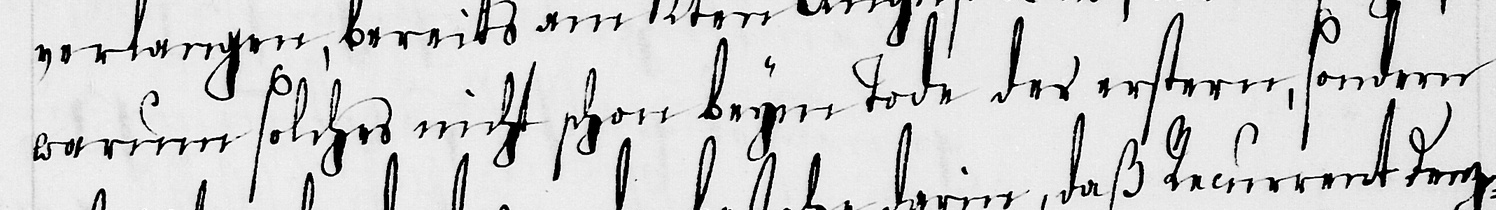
warum solches nicht schon beym Tode der erstern, sondern
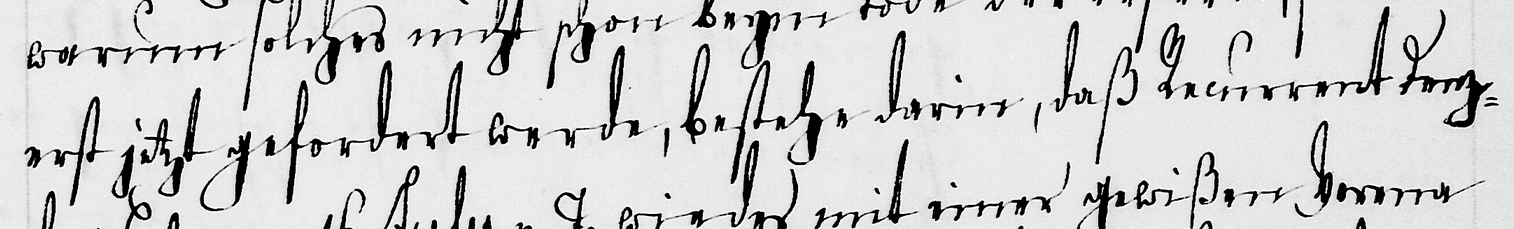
st jetzt gefordert werde, bestehe darin, daß Recurrent Den¬
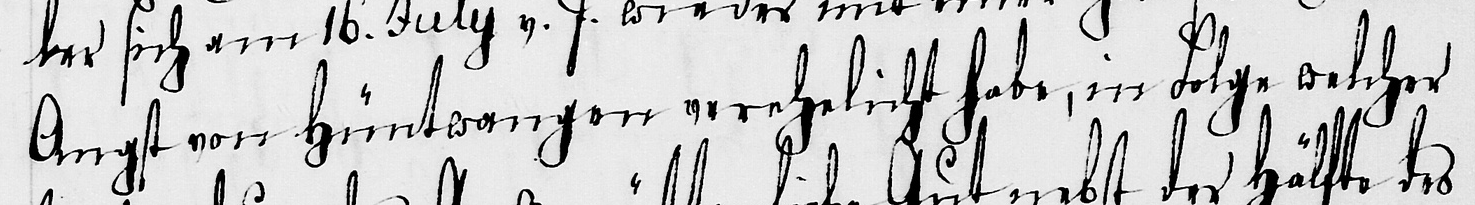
Angst von Hüntwangen verehelicht habe, in Folge welcher
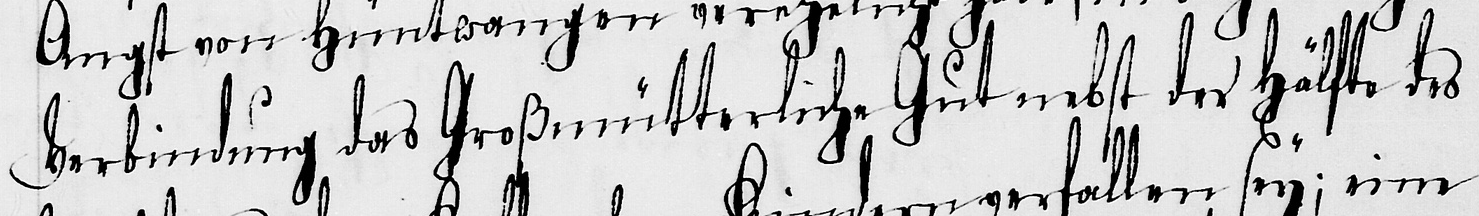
Verbindung das Großmütterliche Gut nebst der Hälfte des
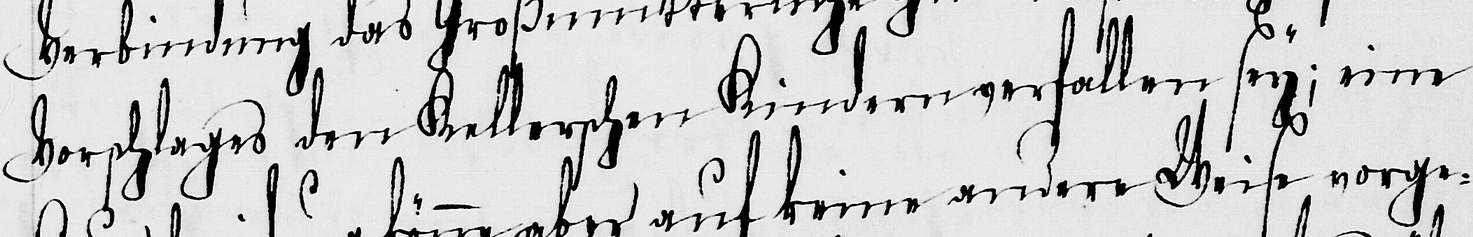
Vorschlages den Kellerschen Kindern verfallen sey; eine
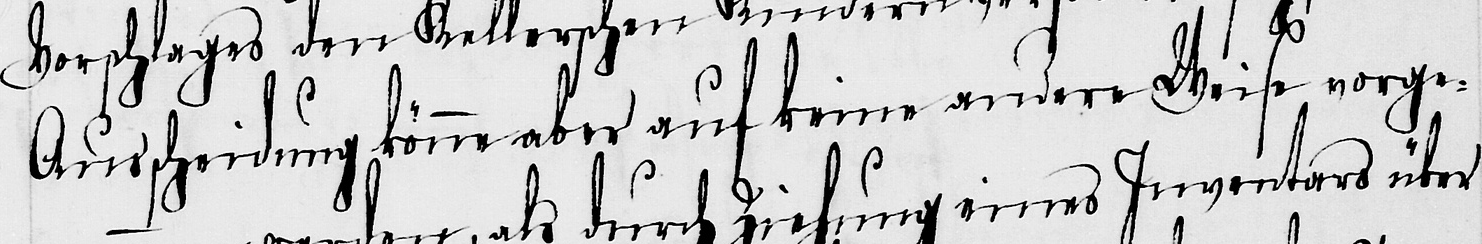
Ausscheidung könne aber auf keine andere Weise vorge¬
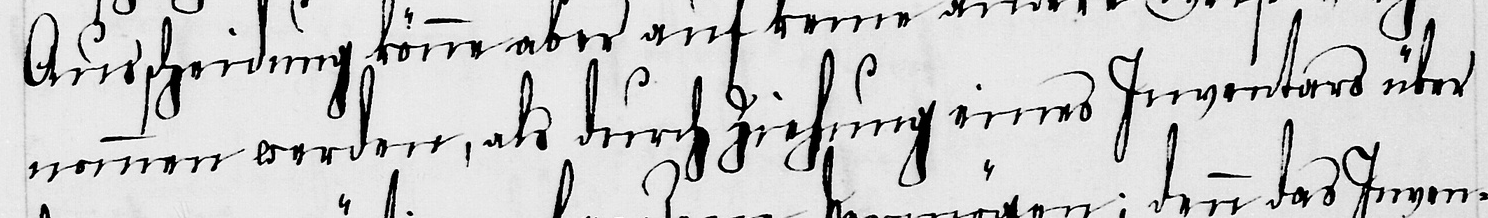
nommen werden, als durch Ziehung eines Inventars über
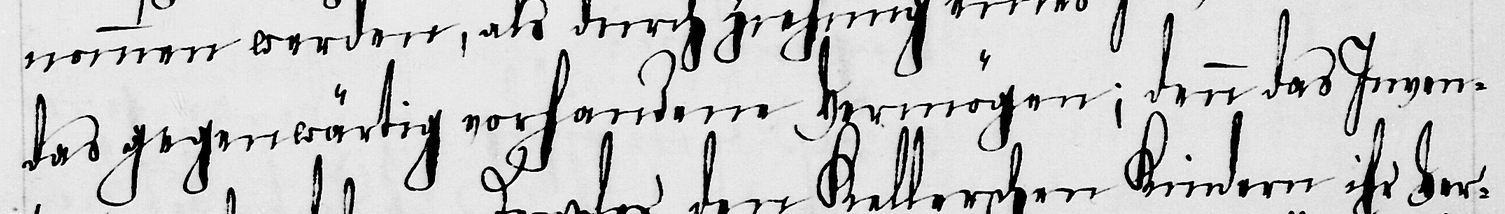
das gegenwärtig vorhandenen Vermögen; denn das Inven¬
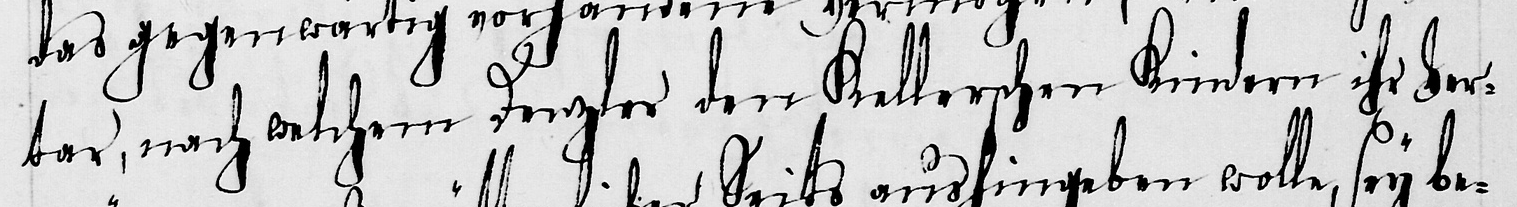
tar, nach welchem Denzler den Kellerschen Kindern ihr Ver¬
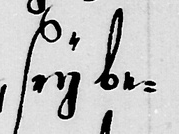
sey be-
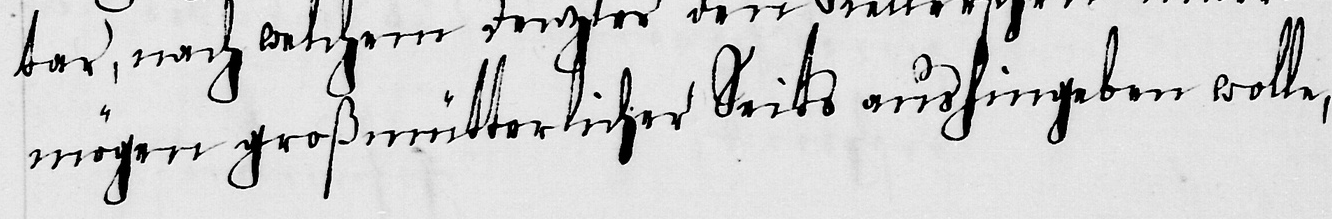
mögen großmütterlicher Seits aushingeben wolle,
